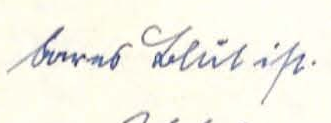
bares Blut ist.
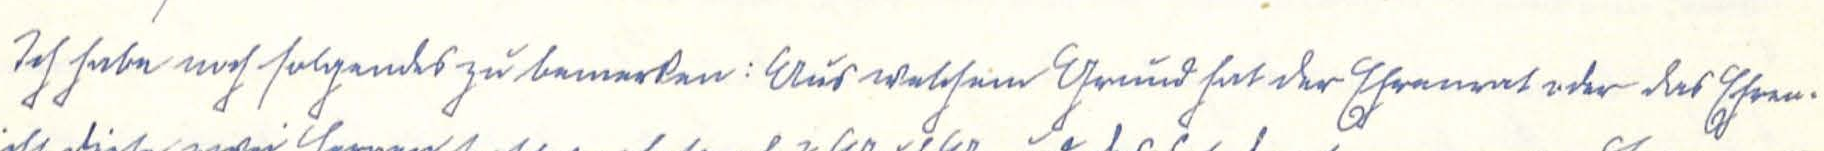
Ich habe noch folgendes zu bemerken: Aus welchem Grund hat der Ehrenrat oder das Ehren-
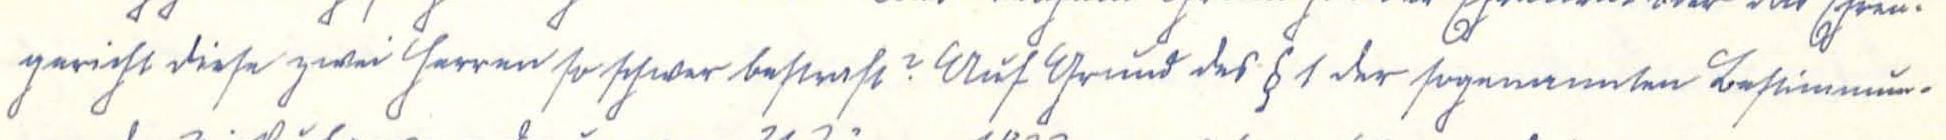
gericht diese zwei Herren so schwer bestraft? Auf Grund des §1 der sogenannten Bestimmun-
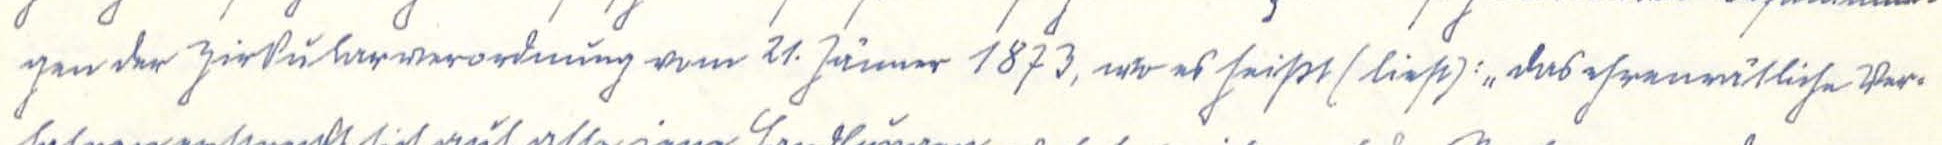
gen der Zirkularverordnung vom 21. Jänner 1873, wo es heißt (liest): "Das ehrenrätliche Ver-
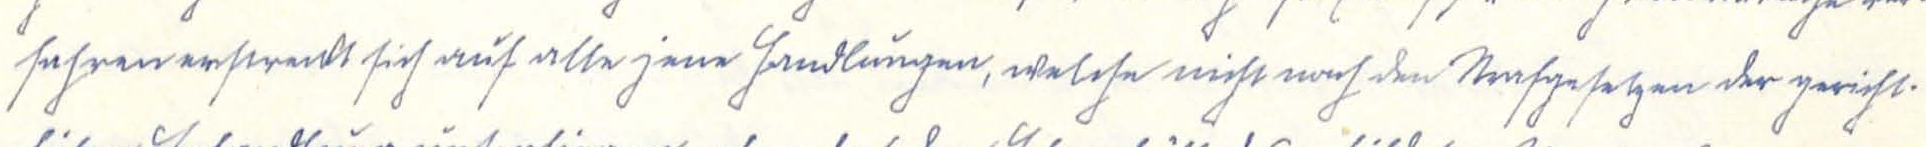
fahren erstreckt sich auf alle jene Handlungen, welche nicht nach den Strafgesetzen der gericht-
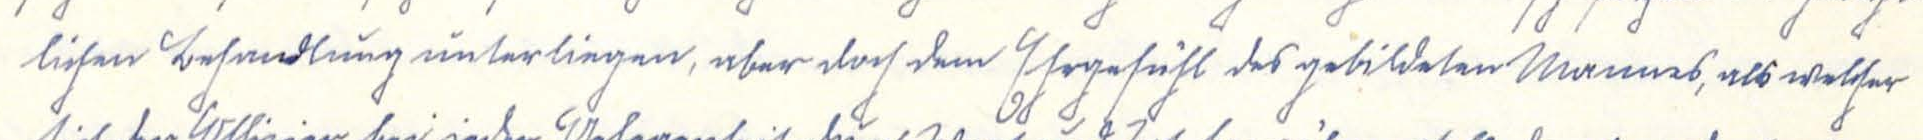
lichen Behandlung unterliegen, aber doch dem Ehrgefühl des gebildeten Mannes, als welcher
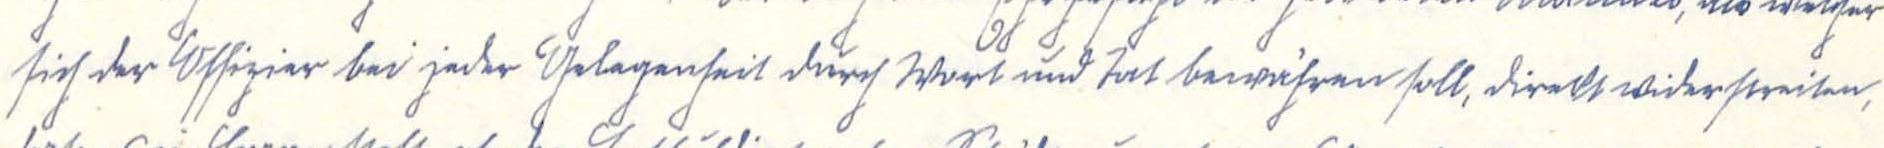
sich der Offizier bei jeder Gelegenheit durch Wort und Tat bewähren soll, direkt widerstreiten,
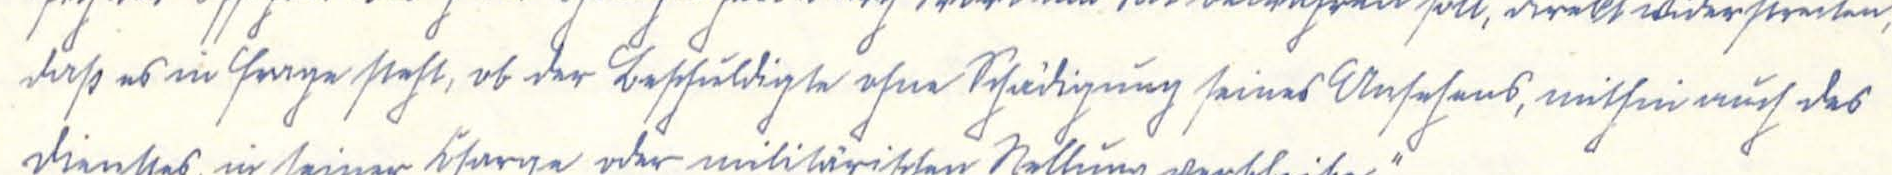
daß es in Frage steht, ob der Beschuldigte ohne Schädigung seines Ansehens, mithin auch des
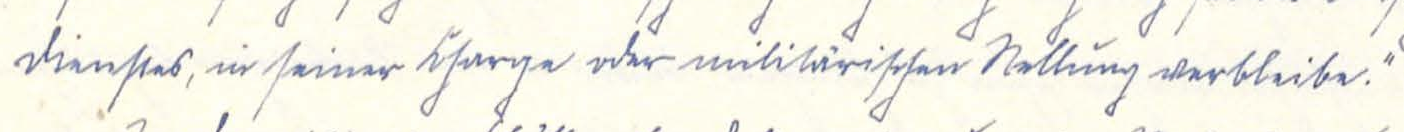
Dienstes, in seiner Charge oder militärischen Stellung verbleibe.“
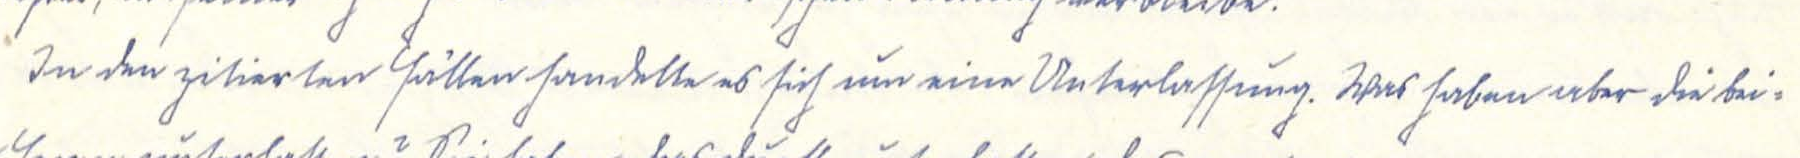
In den zitierten Fällen handelte es sich um eine Unterlassung. Was haben aber die bei-
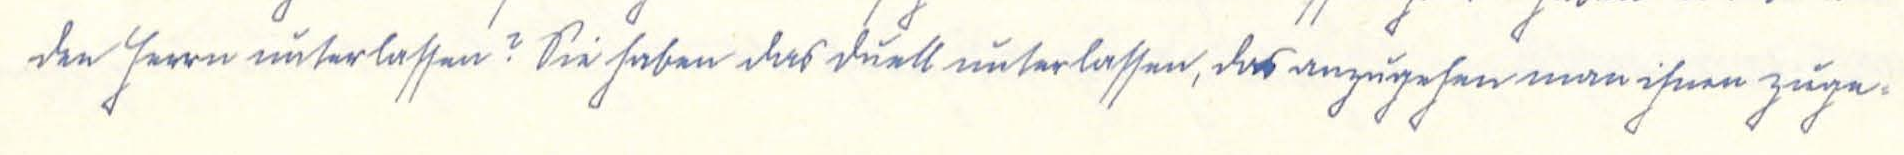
den Herrn unterlassen? Sie haben das Duell unterlassen, das anzugehen man ihnen zuge-
